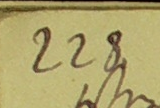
228
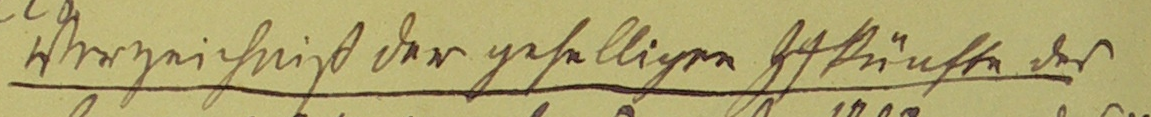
Verzeichnis der geselligen Zusammenkünfte des
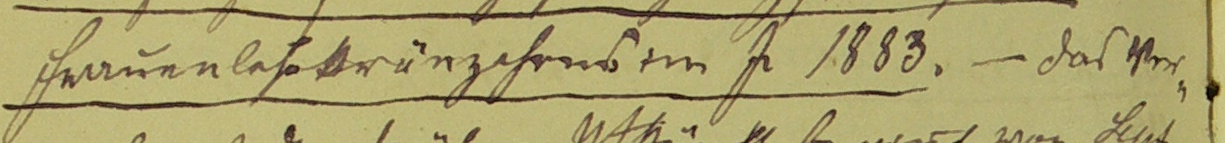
Frauenlesekränzchens im Jahre 1883.—Das Ver¬
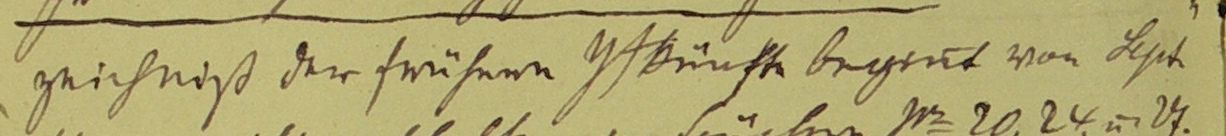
zeichniß der Frühen Zusammenkünfte beginnt von Sept.
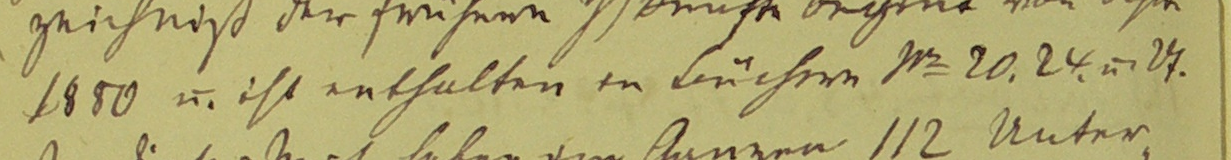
1880 und ist enthalten in Büchern Nr. 20; 24; und 27.-
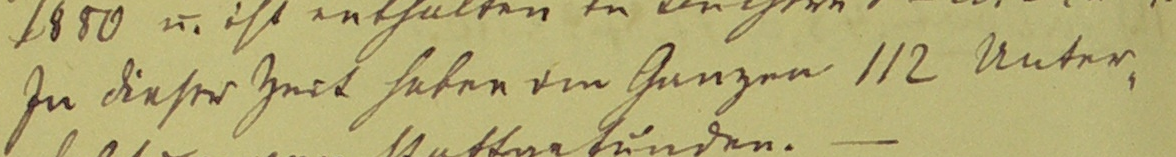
In dieser Zeit haben in Ganzen 112 Unter¬
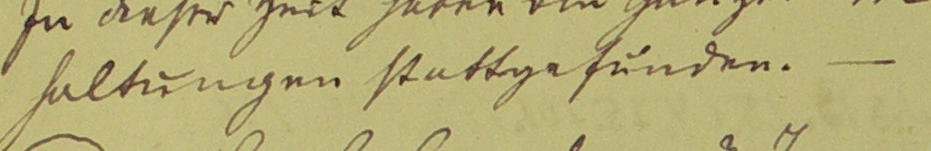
haltungen stattgefunden.—
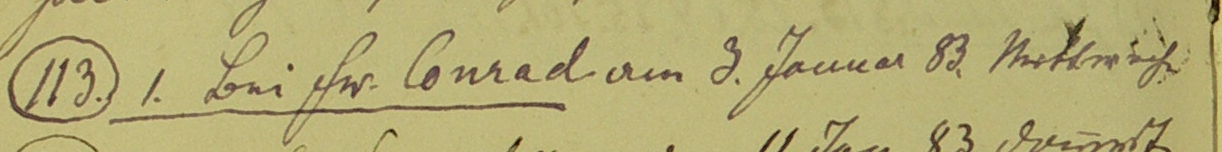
113. 1) Bei Fr. Conrad am 3. Januar 83. Mittwoch
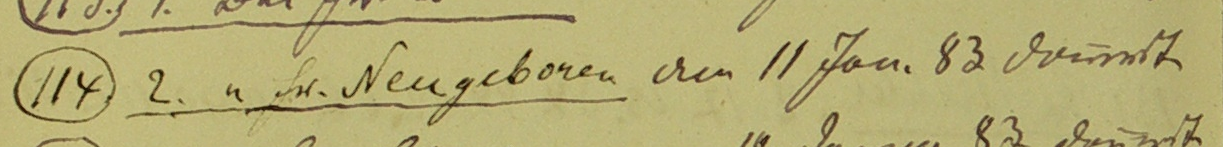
114. 2) Fr. Neugeboren am 11. Jan. 83 Donnerstag
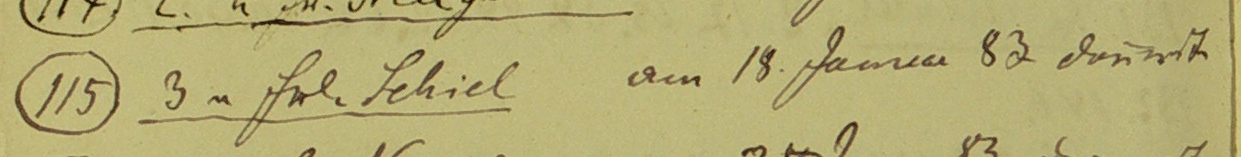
115. 3) Fr. Schiel am 18. Januar 83 Donnerstag
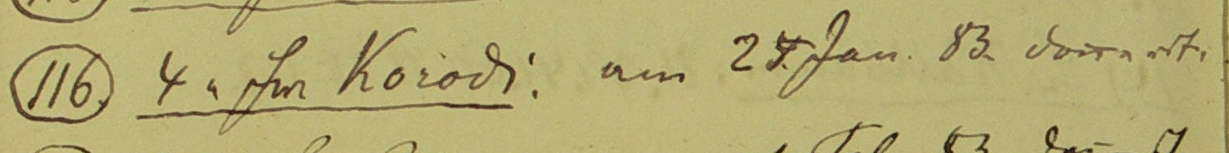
116. 4) Fr. Korodi am 24. Januar 83 Donnerstag
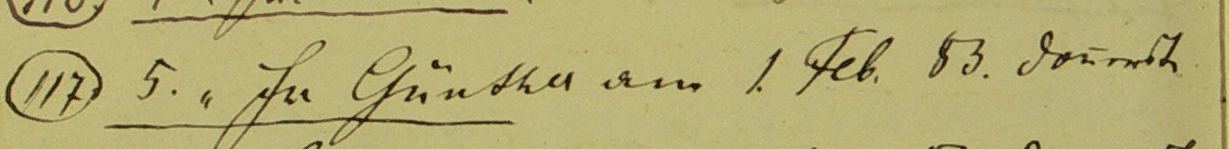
117. 5) Fr. Günther am 1. Februar 83 Donnerstag
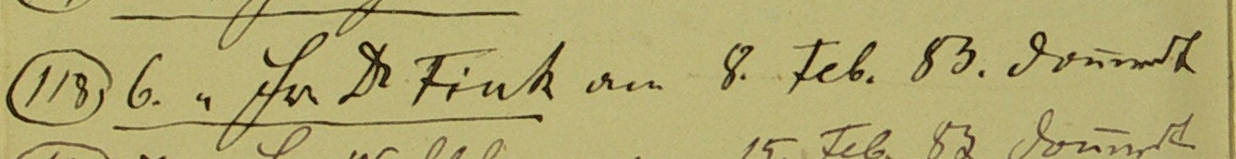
118. 6) Fr. Fink am 8. Februar 83 Donnerstag
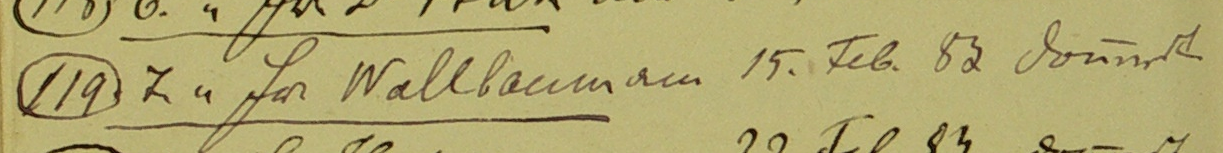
119. 7) Fr. Wallbaumann am 15. Februar 83 Donnerstag
